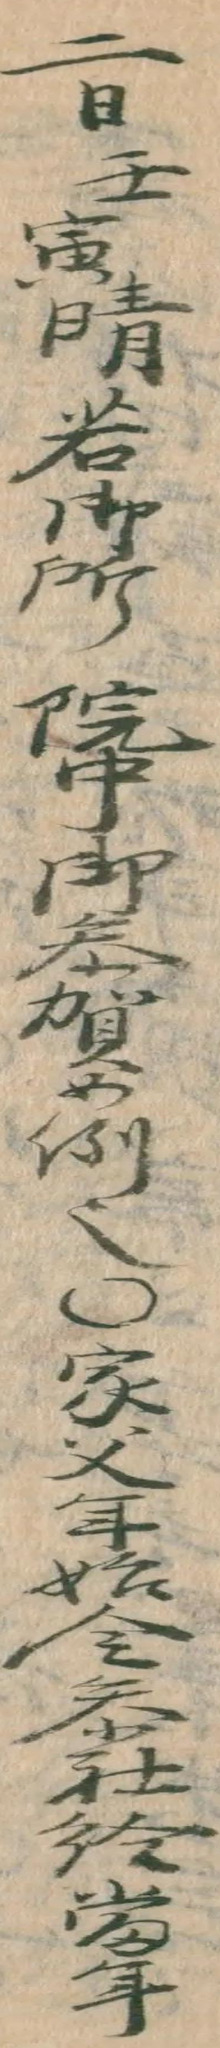二日壬寅晴若御所院中御参賀如例也〇家父年始令恭社給當年
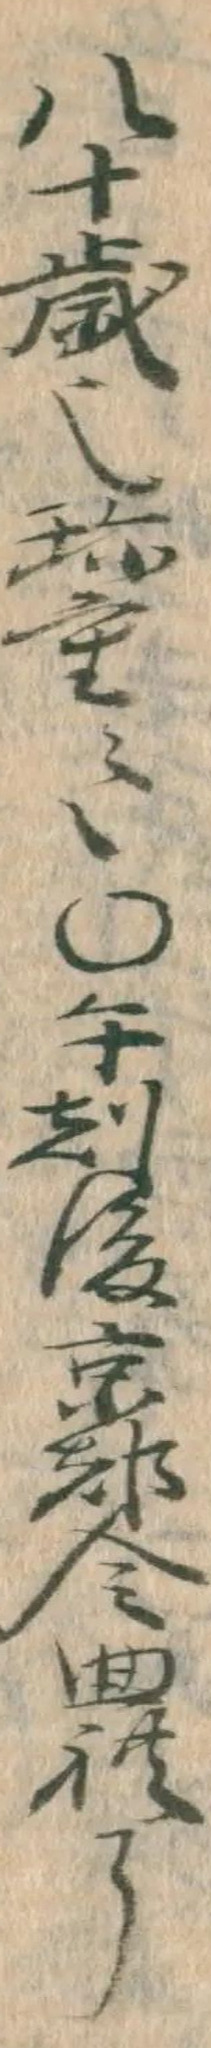八十歳也珍重々々〇午刻後京都令回禮了
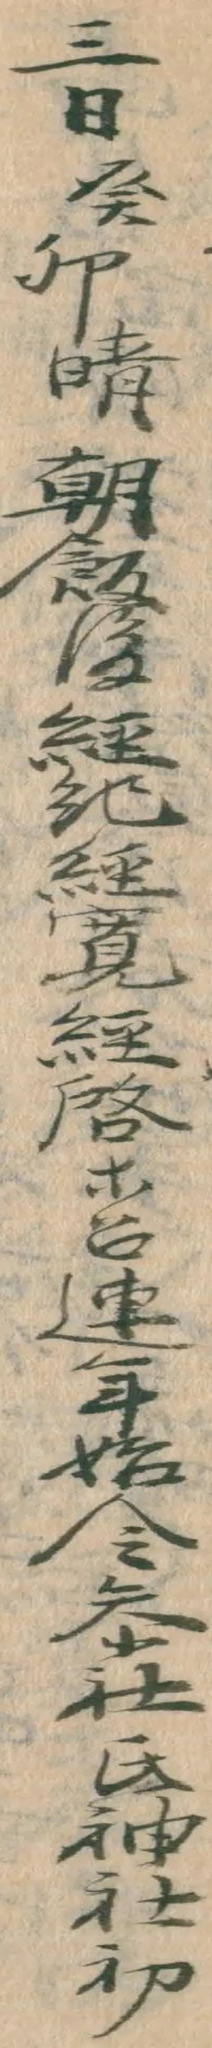三日癸卯晴朝飯後経紀経寛経啓等召連年始令参社氏神社初
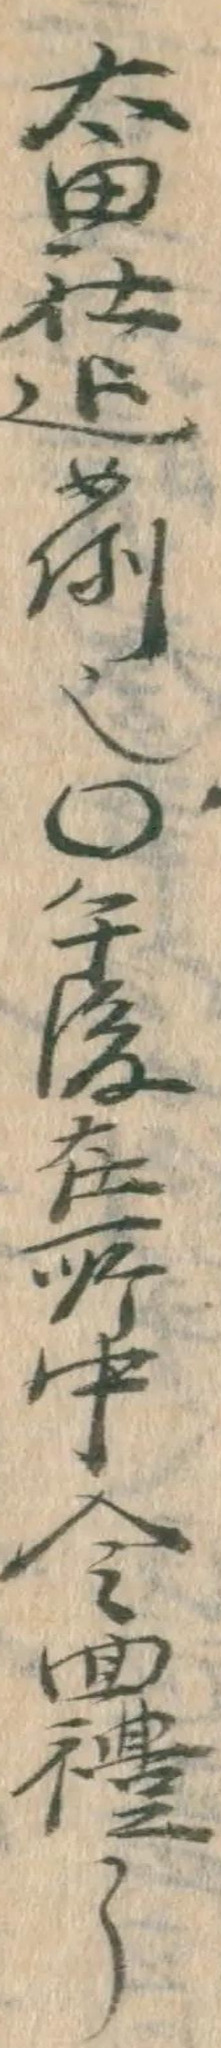太田社迄如例也○午後在所中令回禮了
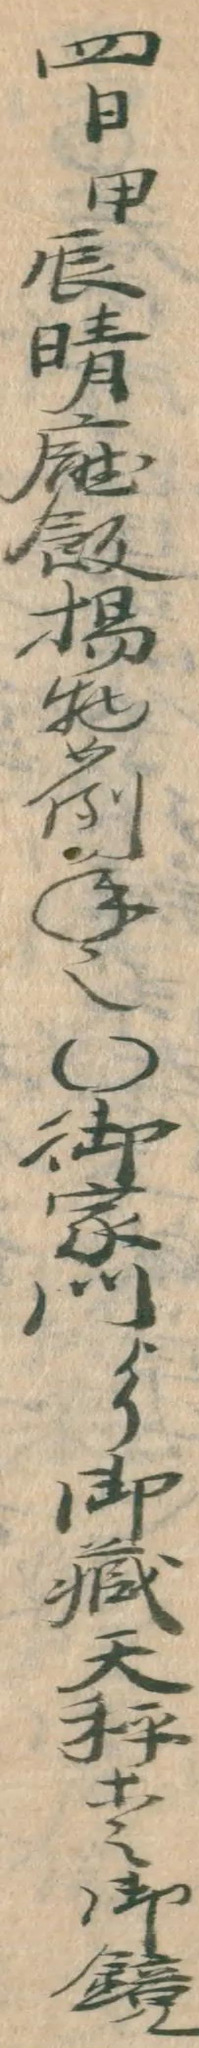四日甲辰晴廳飯揚物如例年也○御家門より御蔵天秤等之御鏡
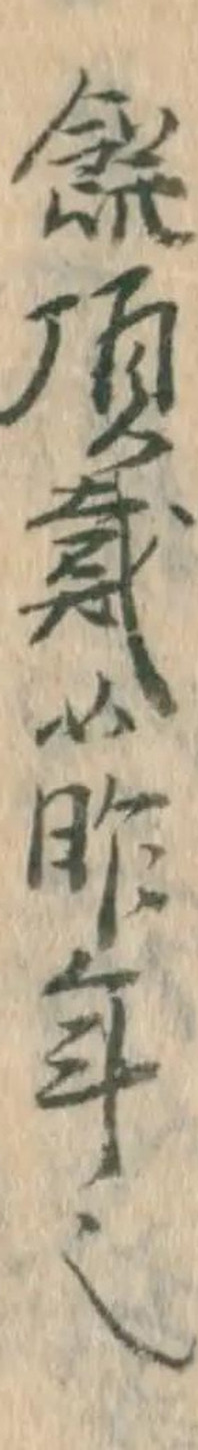餅頂戴如昨年也
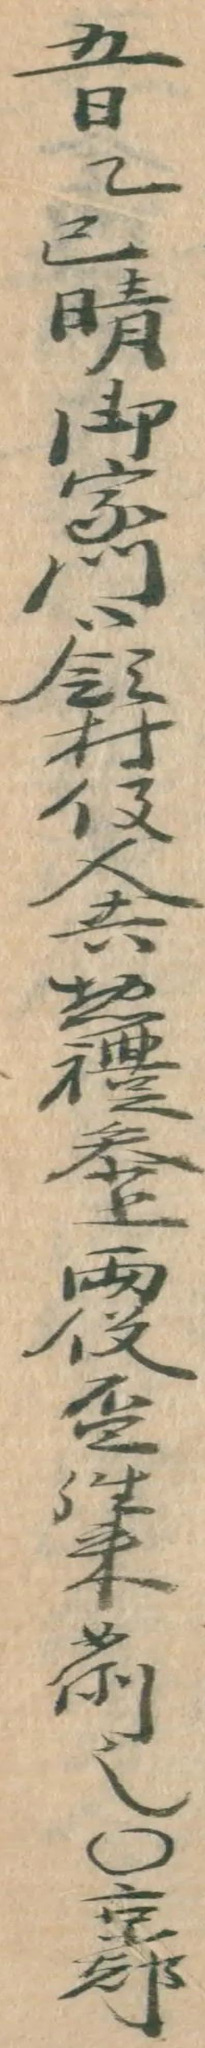五日乙巳晴御家門御領村役人共惣禮参上両役盃往来如例也○京都

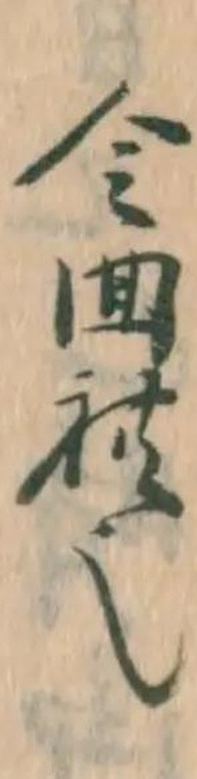令回礼也
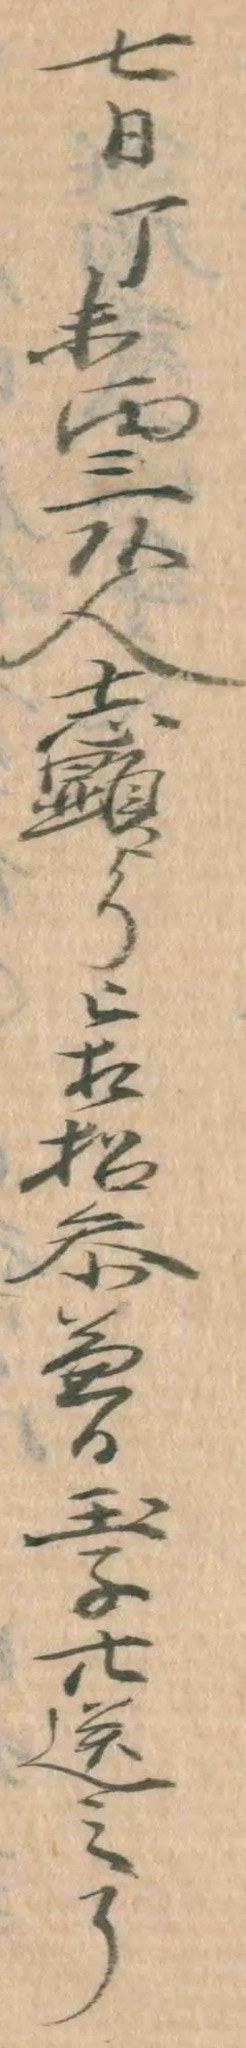七日丁未雨三頭人志顕より被相招参兼日玉子廿送之了
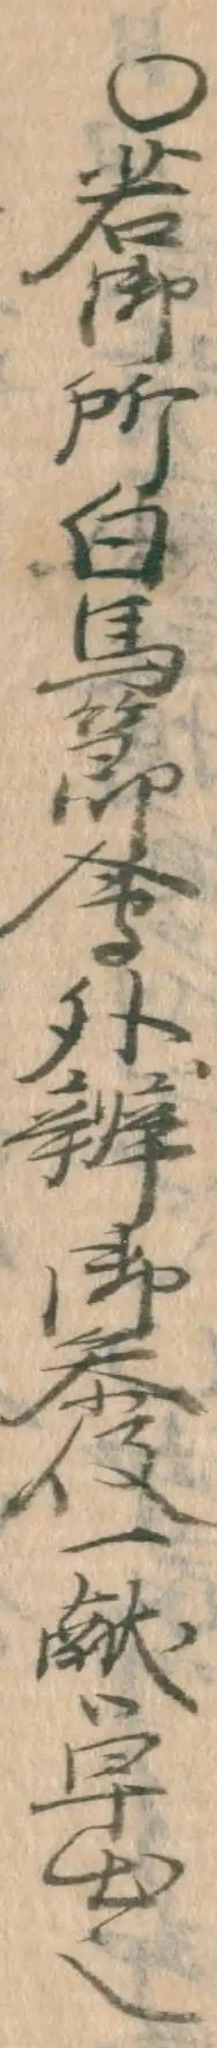○若御所白馬節會外辨御参役一献御早出也
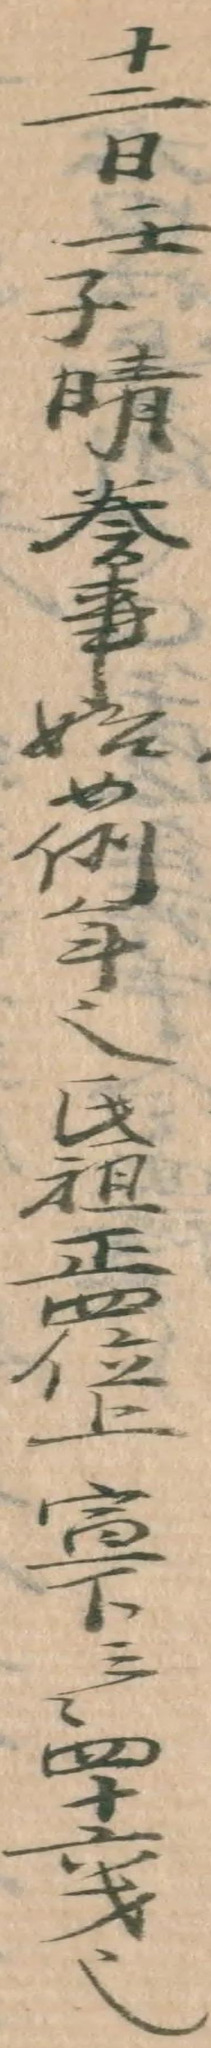十二日壬子晴奏事始如例年也氏祖正四位上宣下云々四十六才也
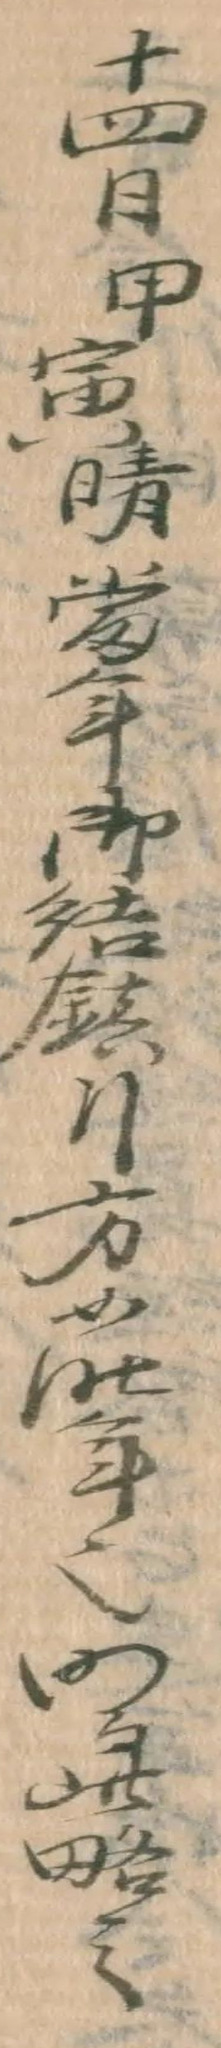十四日甲寅晴當年御結鎮引方如昨年也仍而此略之
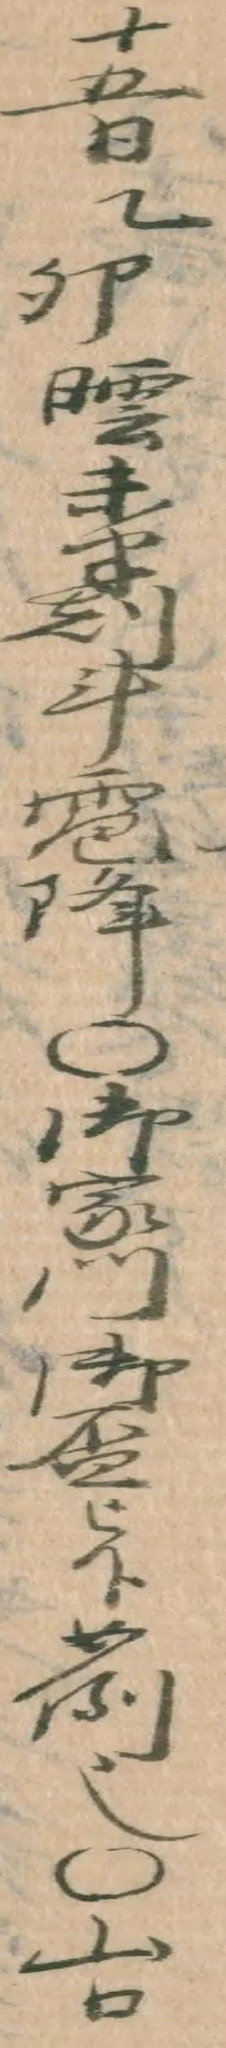十五日乙卯曇未半刻斗雹降○御家門御盃被下如例也○山口
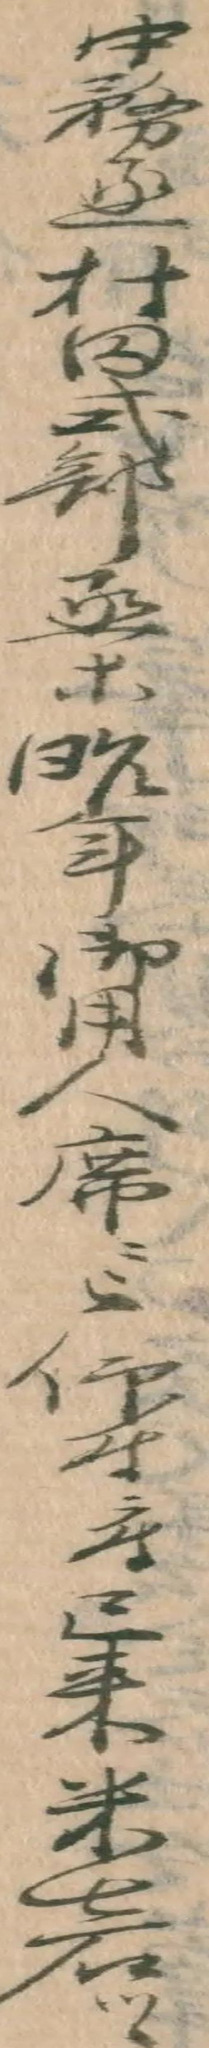中務丞村田式部丞等始年御用人席に被仰付ニ付已来米七石ツヽ
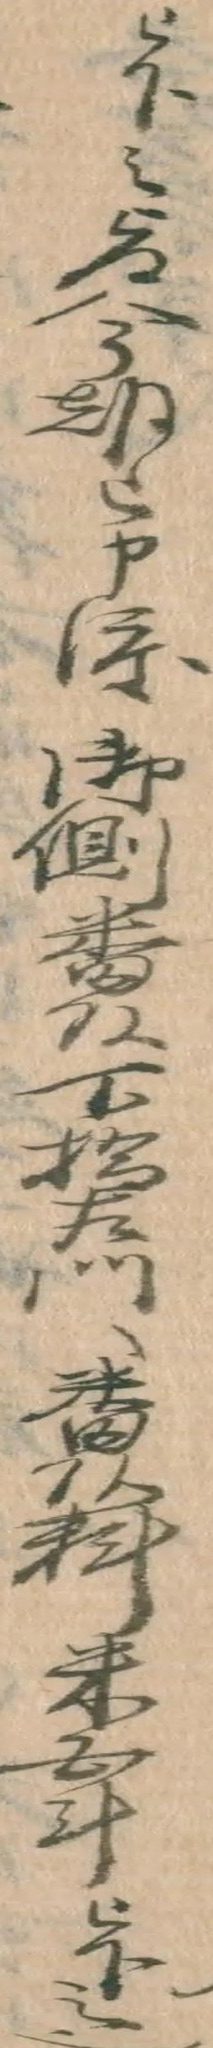被下之旨今朝被申渡御側番頭下橋左門へ番頭料米五斗被下候也
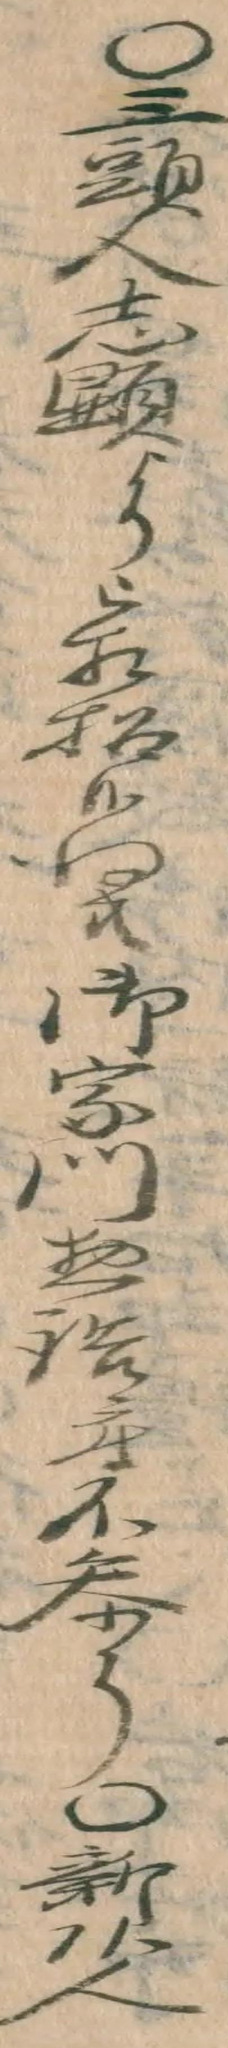○三頭人志顕より被相招候得共御家門惣詰ニ付不参了○新頭人
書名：賀茂社記録. 第65冊
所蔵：国立国会図書館 National Diet Library, JAPAN
